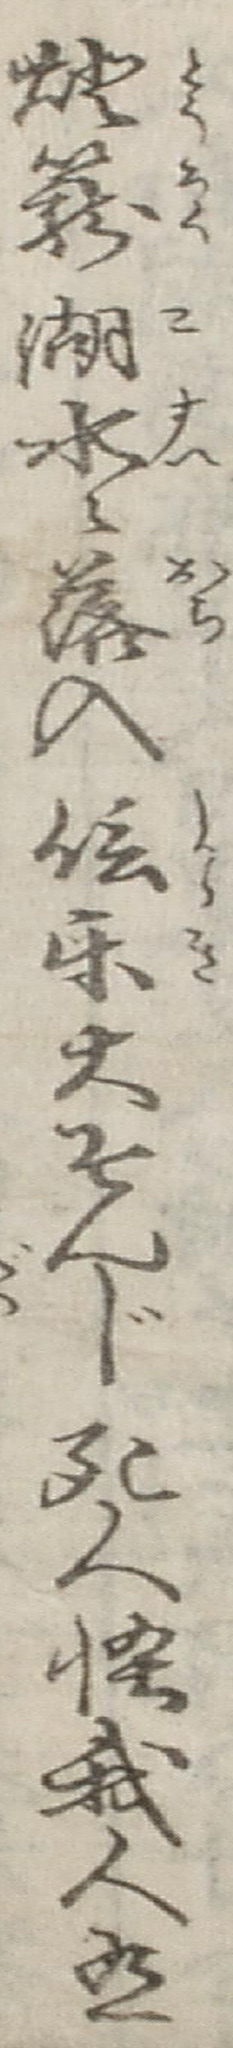燈籠湖水に落入信楽大そんじ死人怪我人有
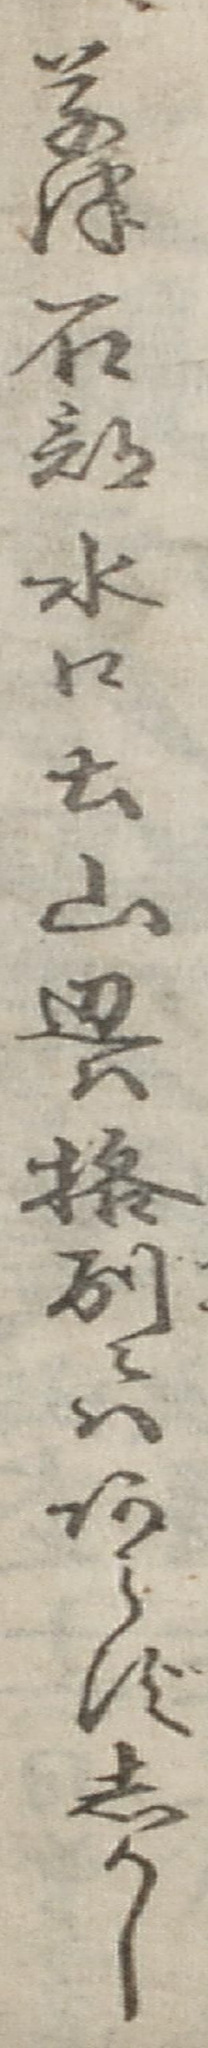草津石部水口土山辺は格別にはあらずしかし
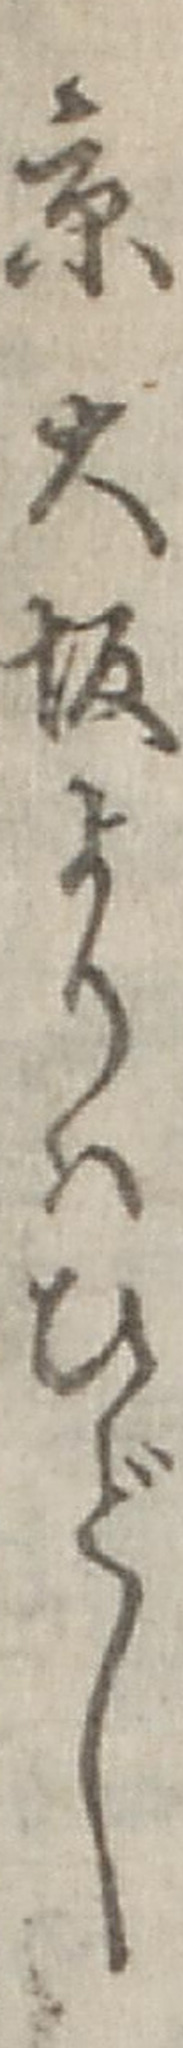京大坂よりはひどし
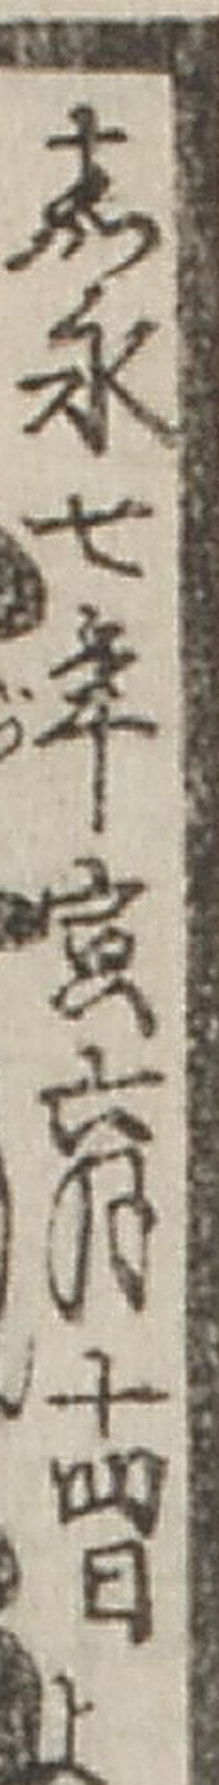嘉永七年寅六月十四日
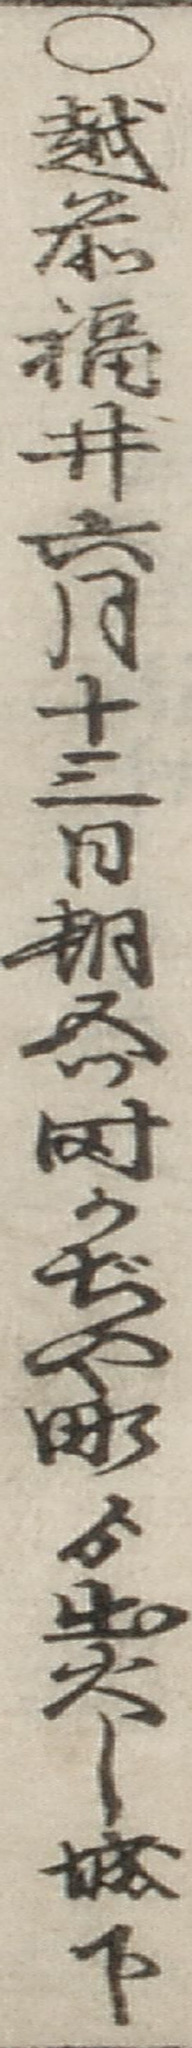○越前福井六月十三日朝五ツ時かぢや町ゟ出火し城下
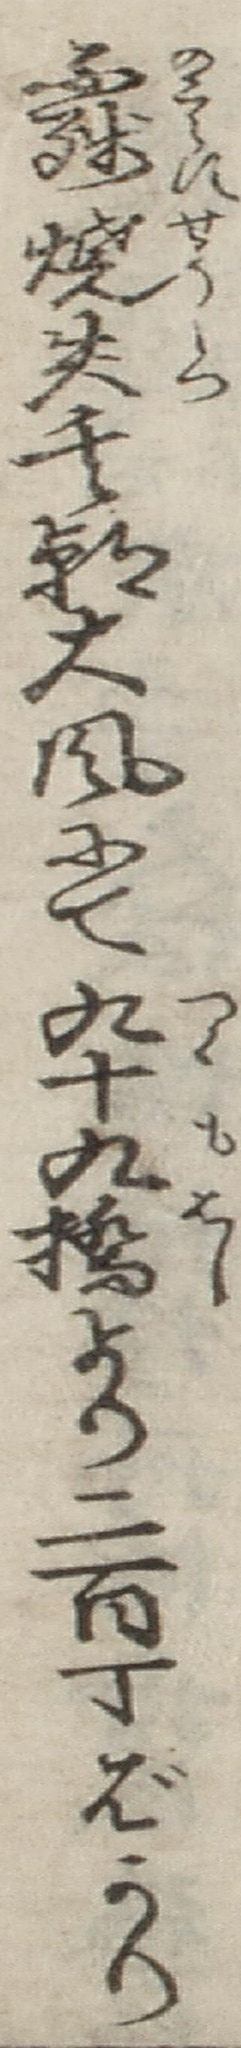不残焼失其朝大風にて九十九橋より二百丁ばかり
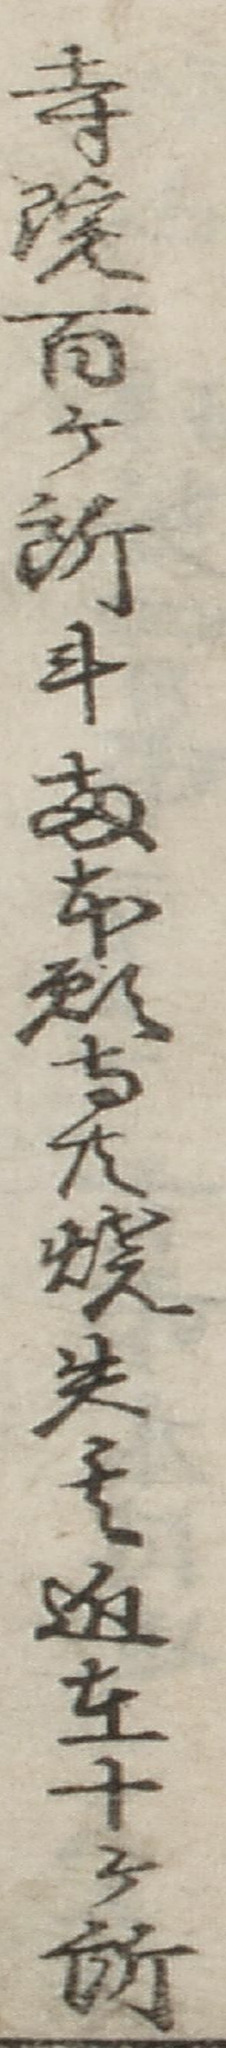寺院百カ所斗両本願寺共焼失其近在十ケ所
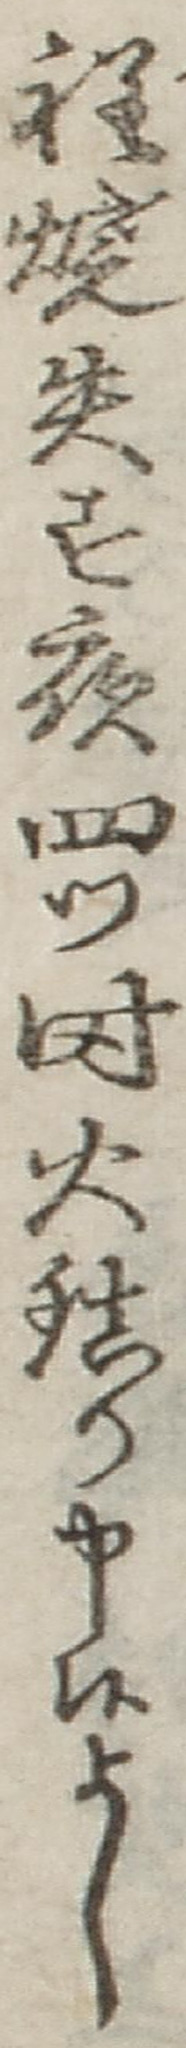程焼失す夜四ツ時火鎮り申候よし
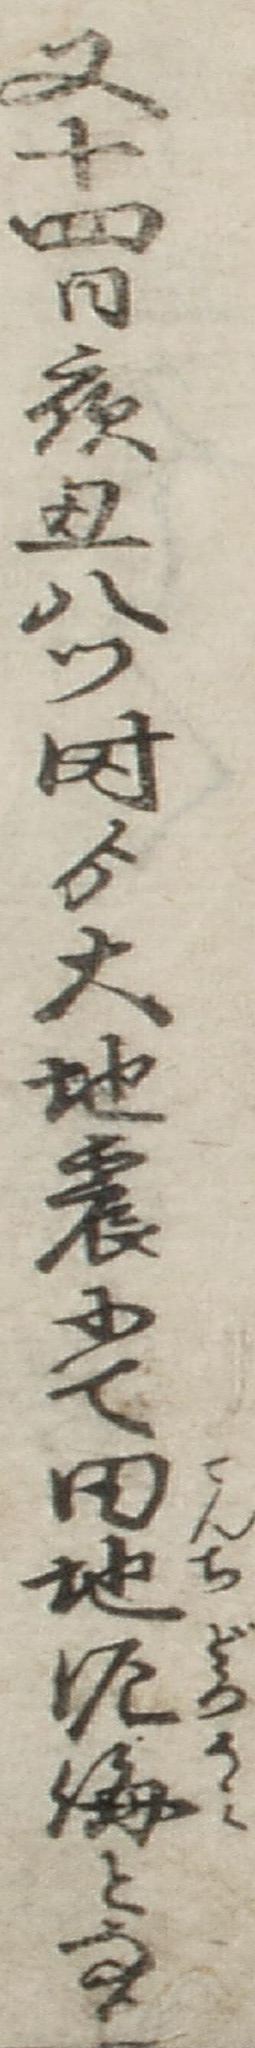又十四日夜丑八ツ時ゟ大地震にて田地泥海となり？
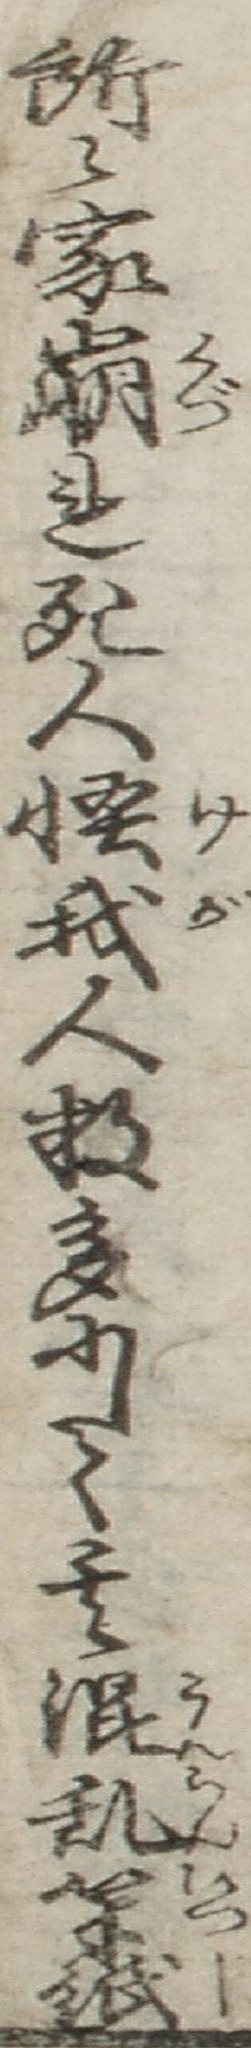所〻家崩れ死人怪我人数多にて其混乱筆紙

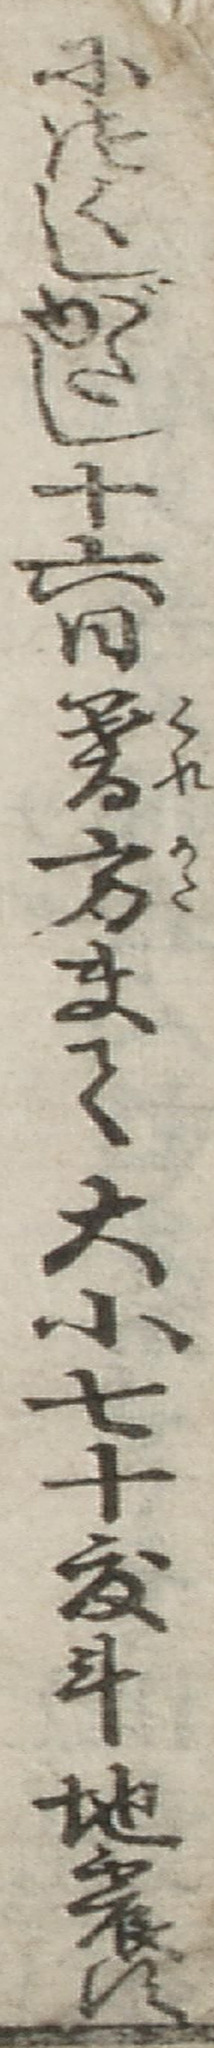につくしがたし十六日暮方まて大小七十度斗地震す
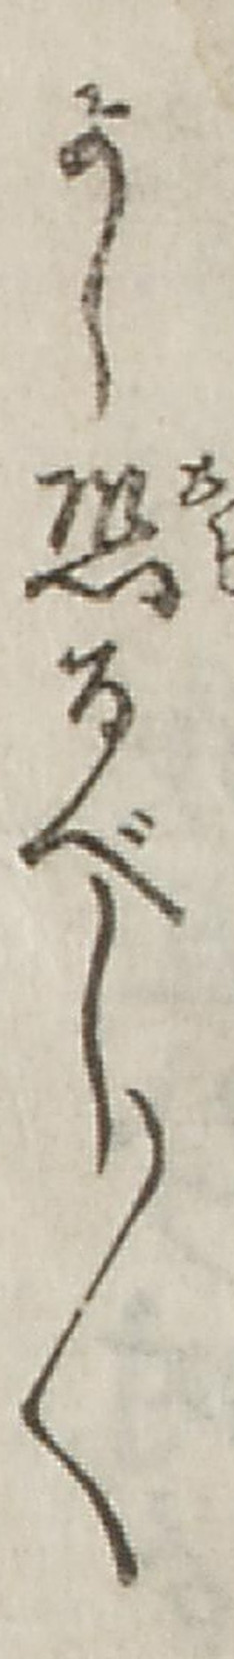よし恐るべし〳〵
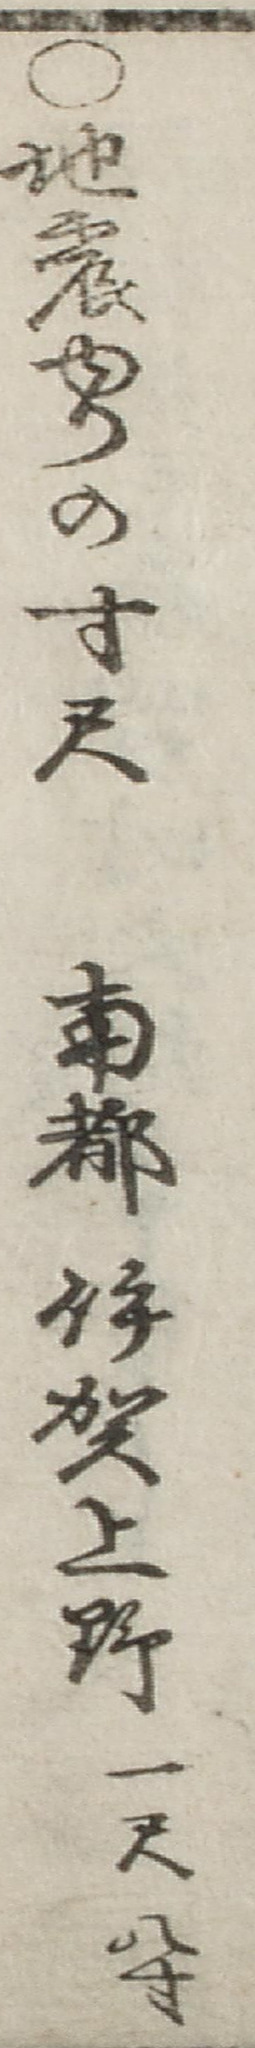○地震ゆりの寸尺南都伊賀上野一尺八寸
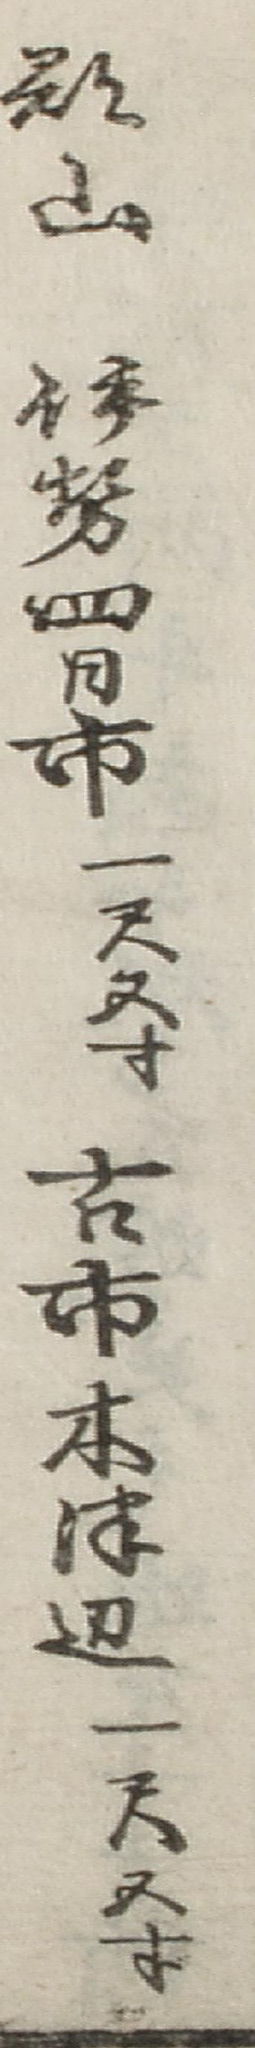郡山伊勢四日市一尺五寸古市木津辺一尺五寸
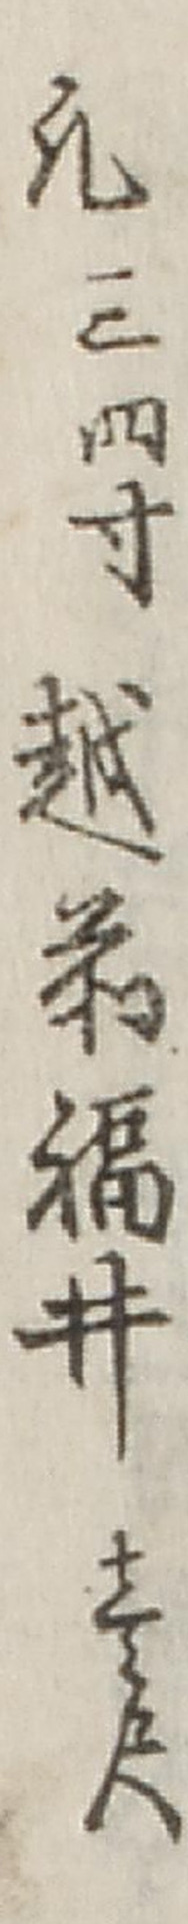凡三四寸越前福井壱尺
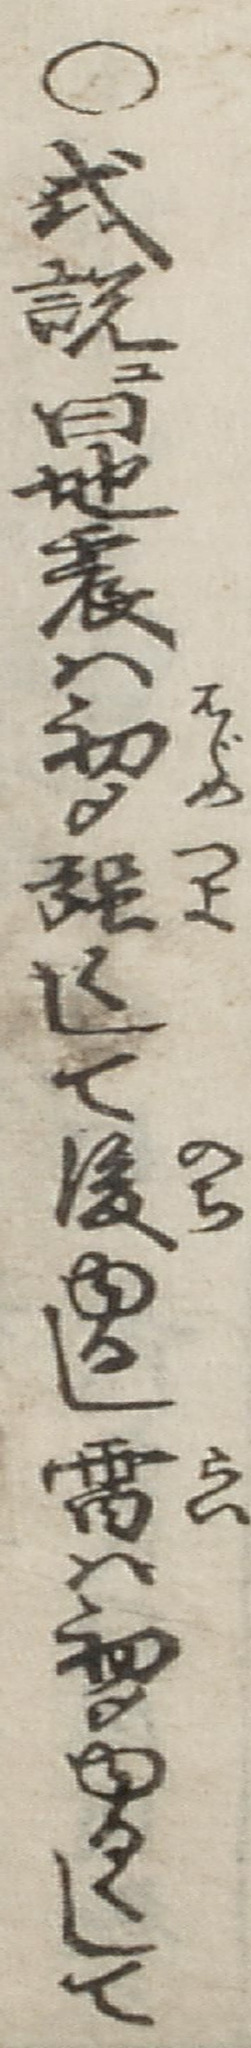○或説ニ曰地震は初メ強くして後ゆるし雷は初メゆるくして
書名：地震世直草紙　全
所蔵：東京大学地震研究所図書室 Earthquake Research Institute Library, The University of Tokyo, JAPAN
